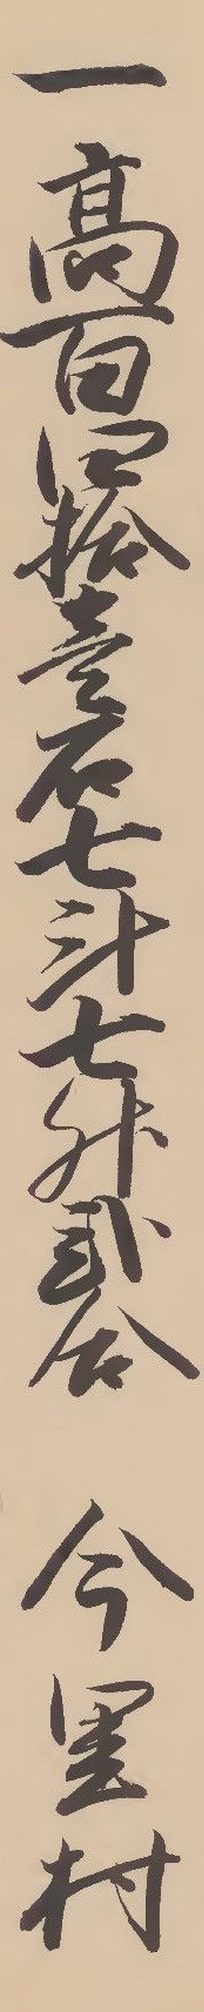一高百四拾壱石七斗七升弐合今里村
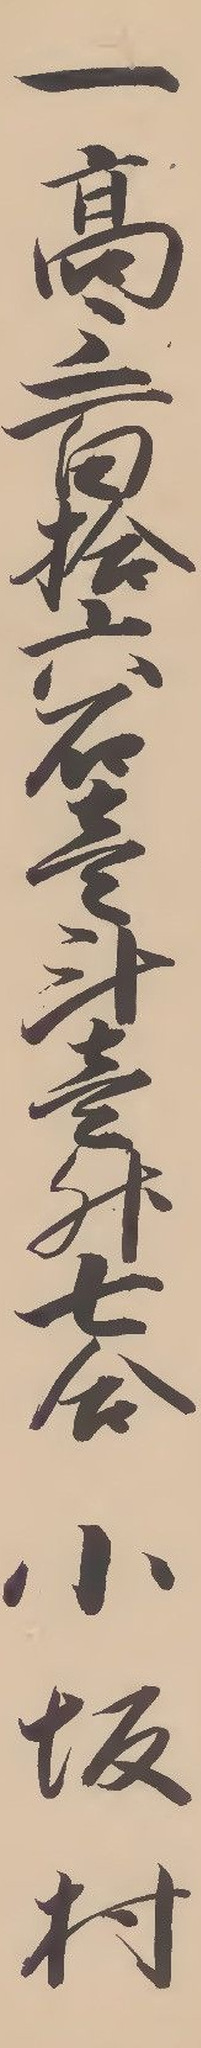一高三百拾六石壱斗壱升七合小坂村

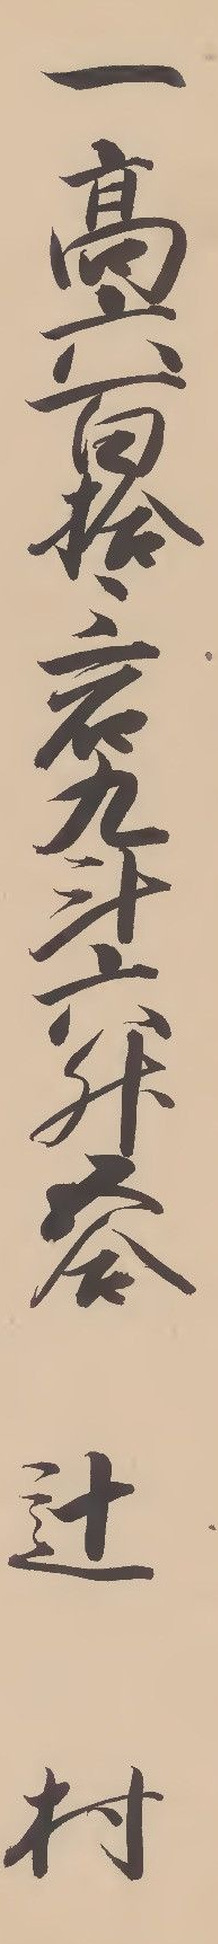一高六百拾三石九斗六升五合辻村
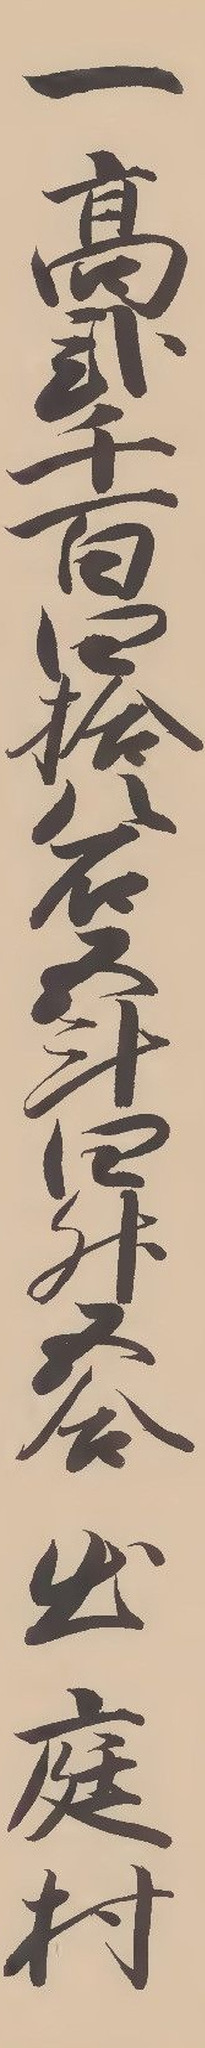一高弐千百四拾八石五斗四升五合出庭村
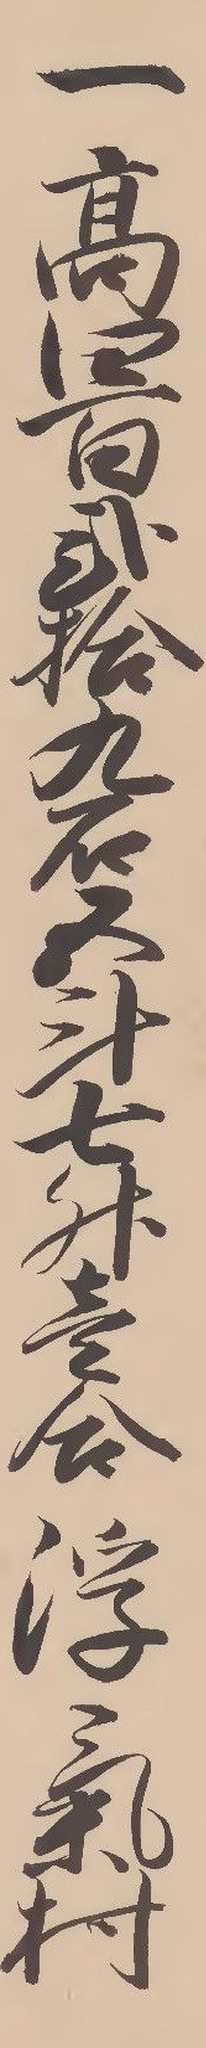一高四百弐拾九石五斗七升壱合浮気村
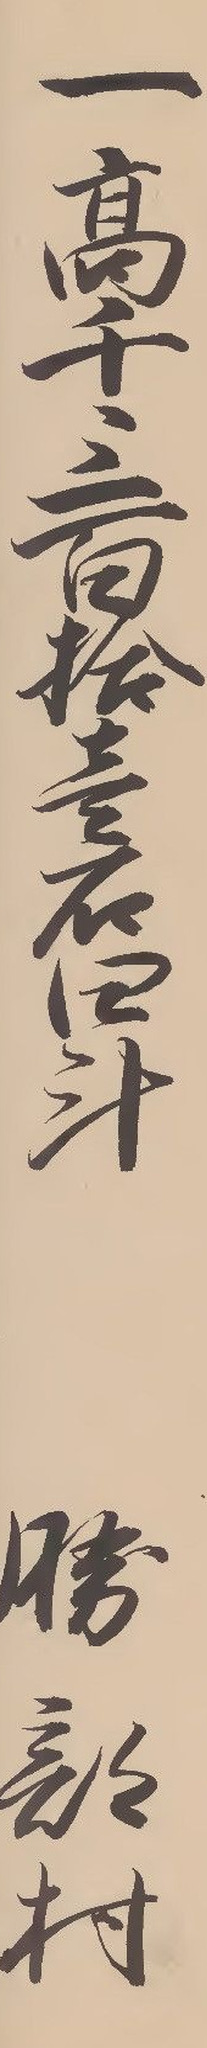一高千三百拾壱石四斗勝部村
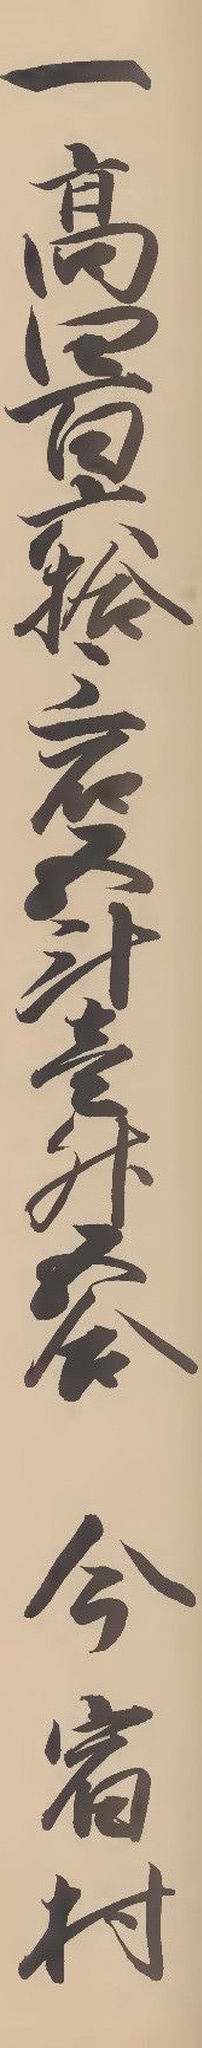一高四百六拾三石五斗壱升五合今宿村
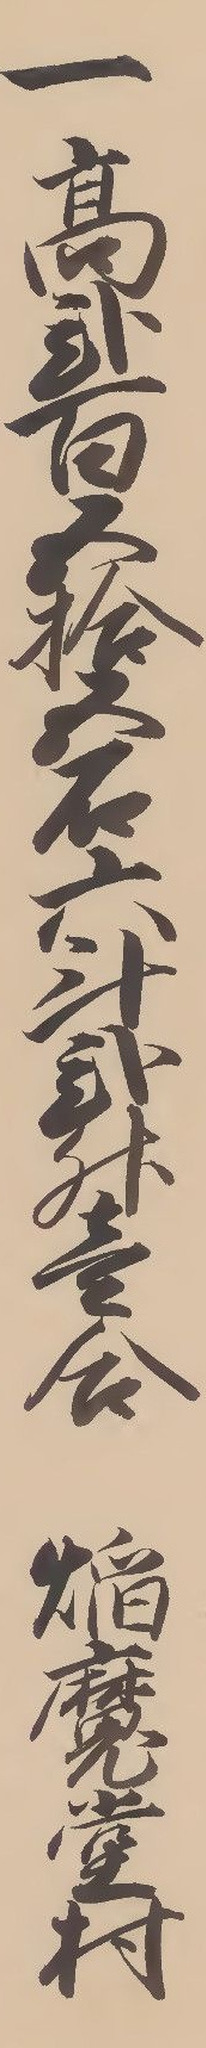一高弐百五拾五石六斗弐升壱合焔魔堂村
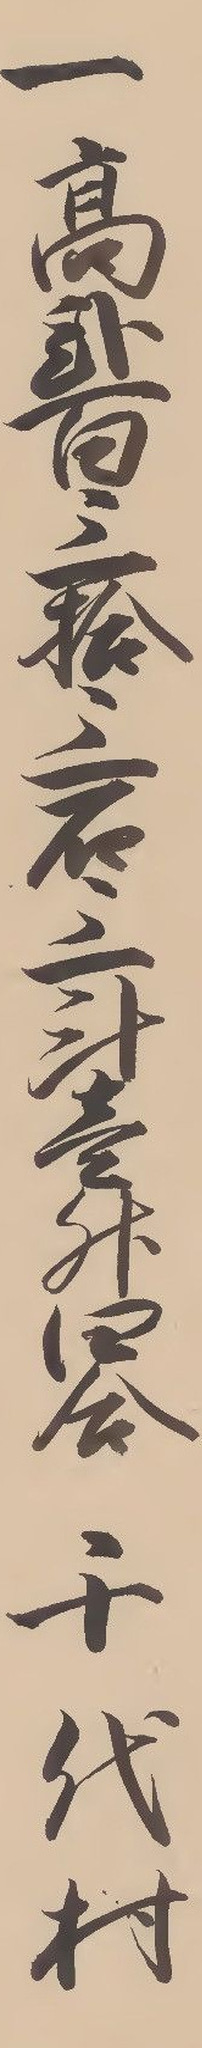一高弐百三拾三石三斗壱升四合千代村
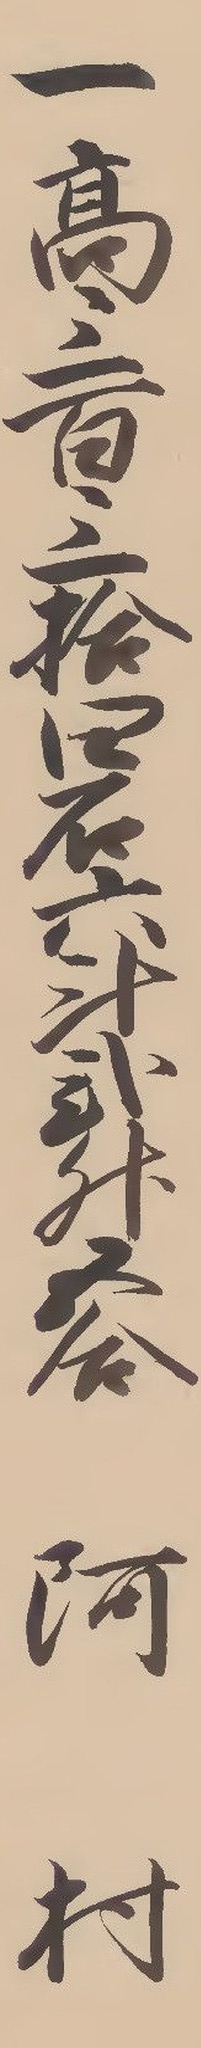一高三百三拾四石六斗弐升五合阿村

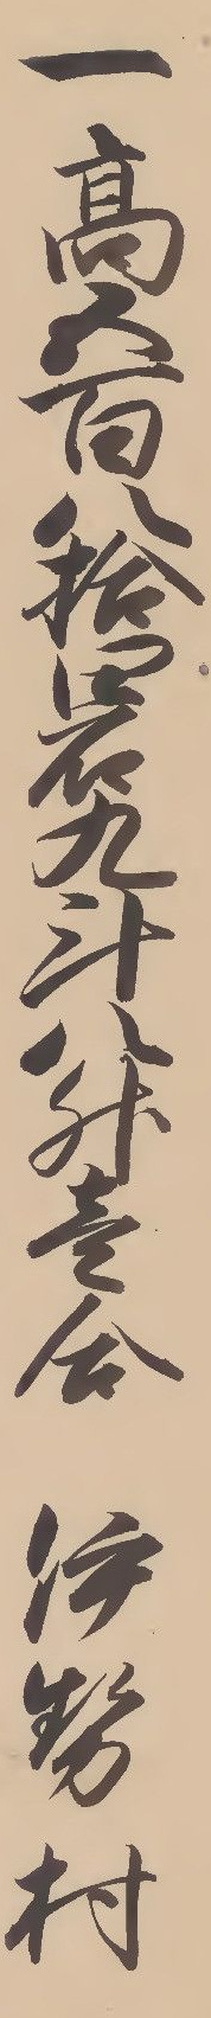一高五百八拾四石九斗八升壱合伊勢村
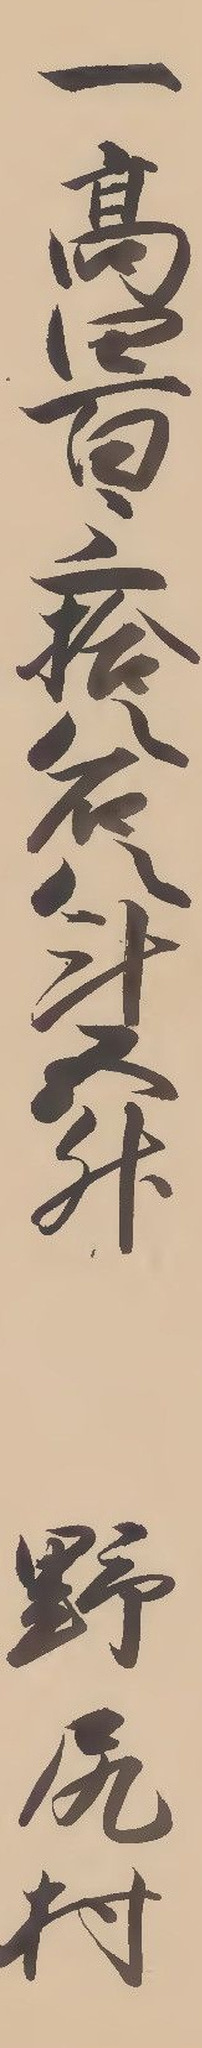一高四百三拾八石八斗五升野尻村
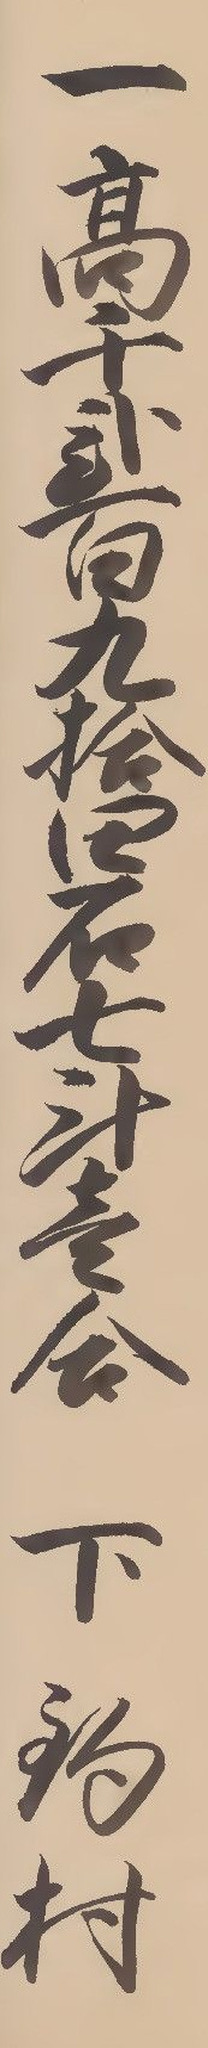一高千弐百九拾四石七斗壱合下鈎村
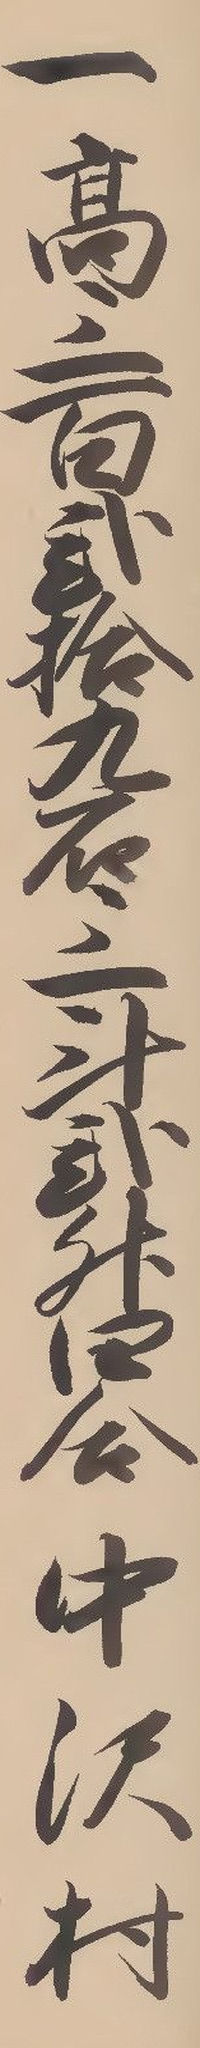一高三百弐拾九石三斗弐升四合中沢村
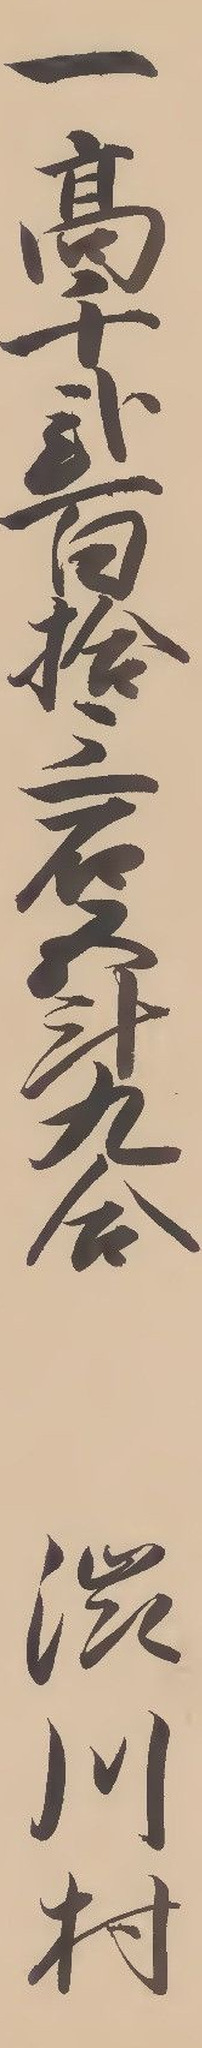一高千弐百拾三石五斗九合渋川村
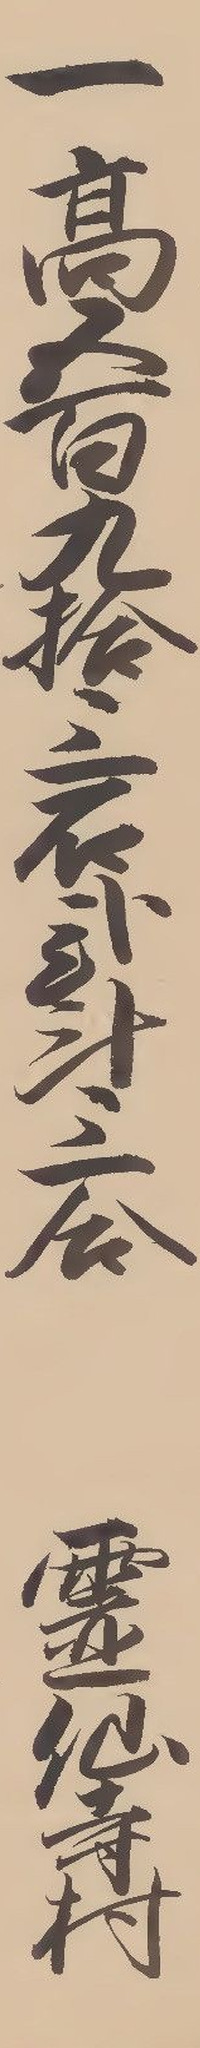一高五百九拾三石弐斗三合霊仙寺村
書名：近江国郷帳
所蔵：国立公文書館 National Archives of Japan
